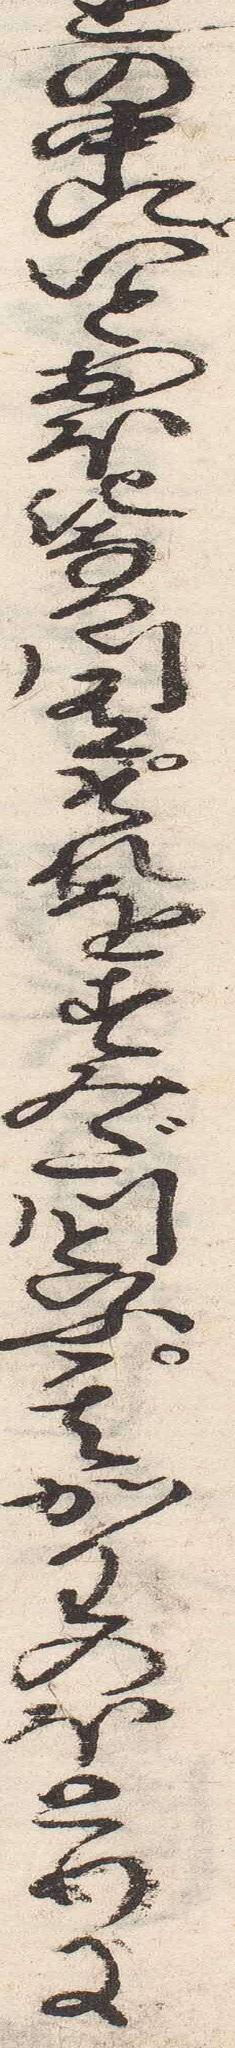との中に。いとおほきなる川有。それをすみだ川といふ。其かわのほとりに
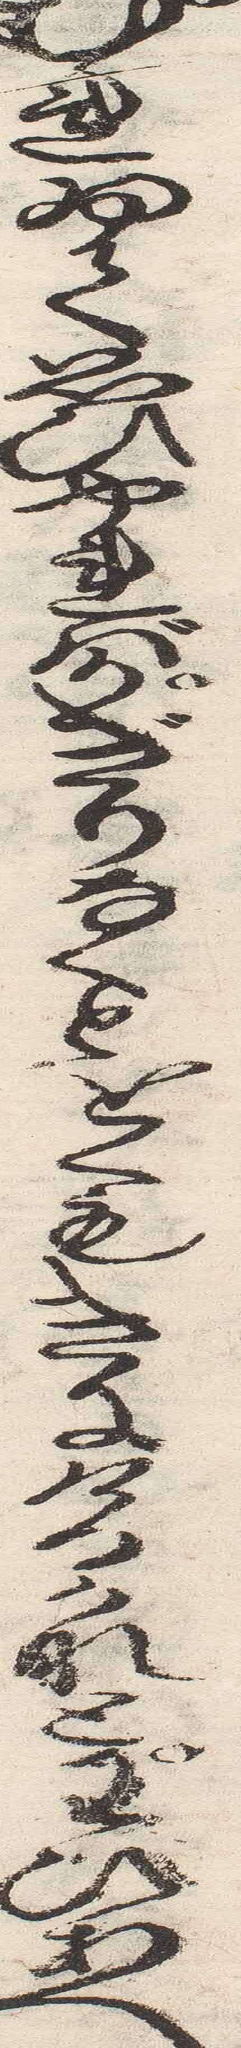。むれゐて思ひやれば。かぎりなくとをくもきにけるかなと。わひあへ
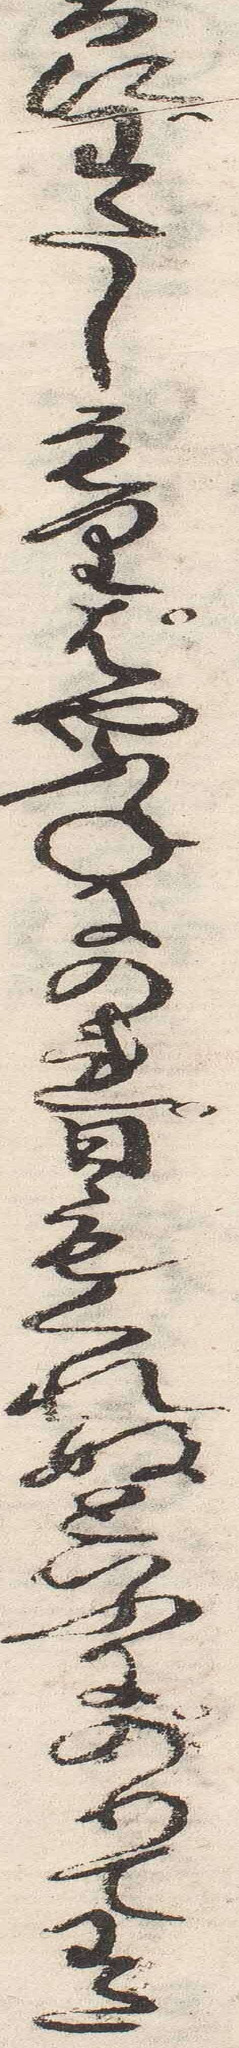るに。わたしもり。はやふねにのれ。日もくれぬといふに。のりてわた
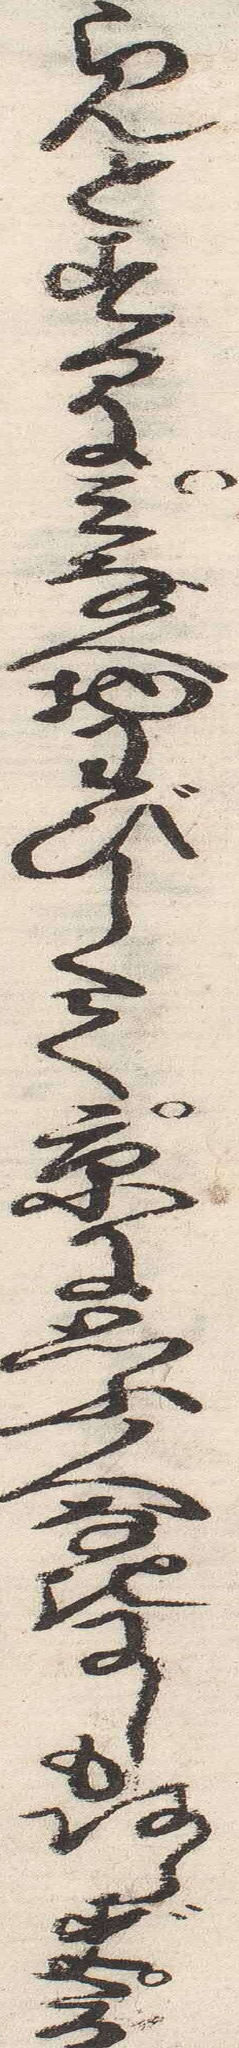らんとするに。みな人物わびしくて。京に思ふ人なきにしもあらず。さる
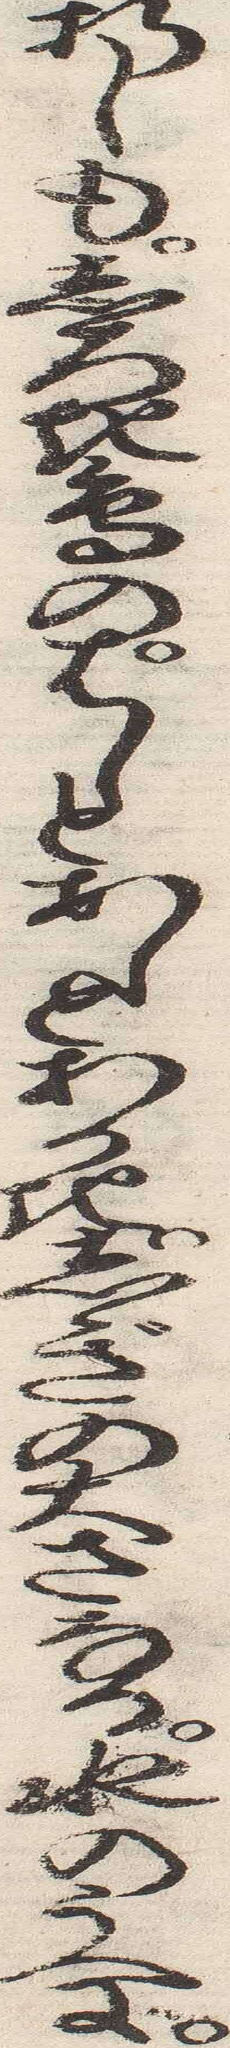折しも。しろき鳥の。はしとあしとあかき。しぎの大さなる。水のうへに。
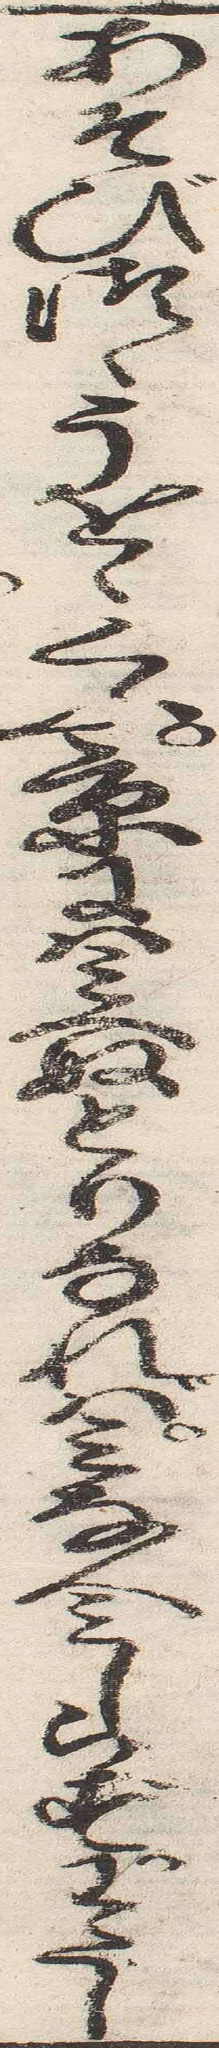あそびつゝうをゝくふ。京にはみへぬとりなれば。みな人みしらず。わたし
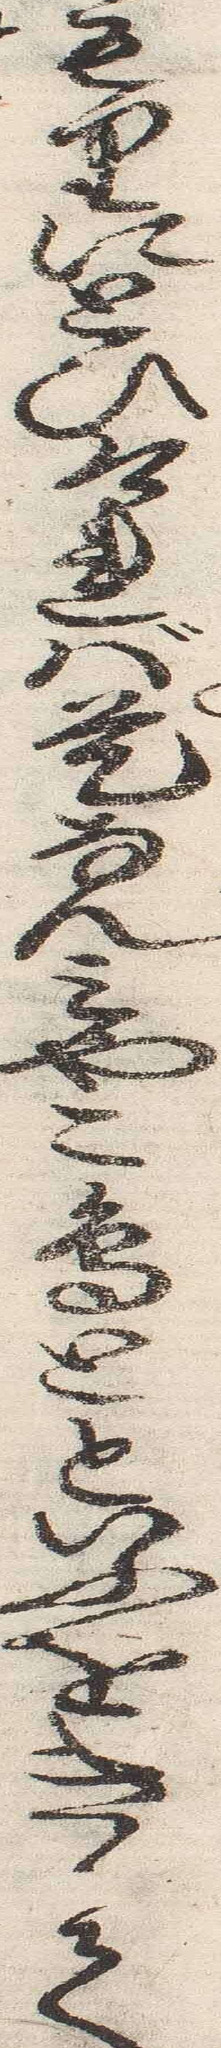もりにとひければ。是なんみやこ鳥とといふをきゝて
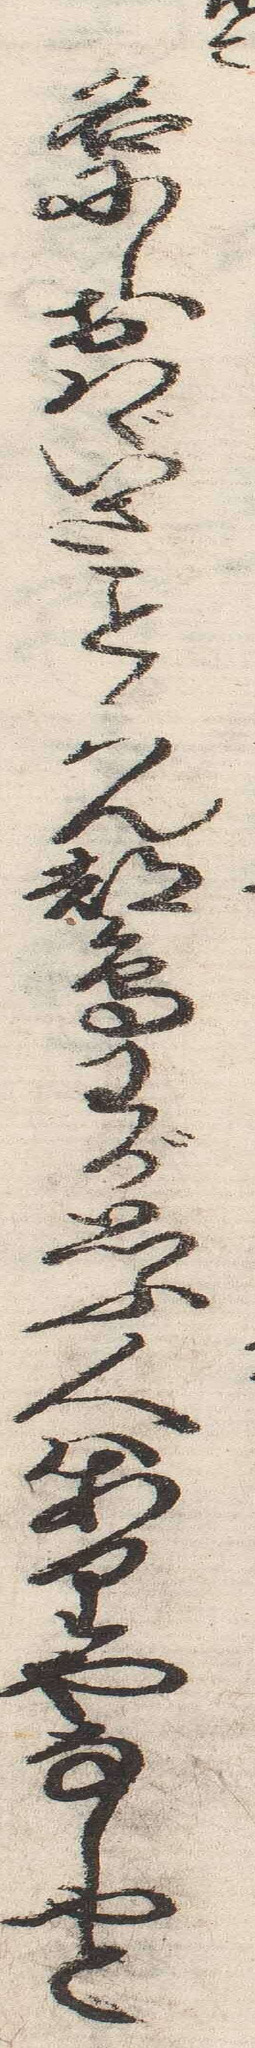古今名にしおはゞいさことゝはん都鳥わが思ふ人はありやなしやと
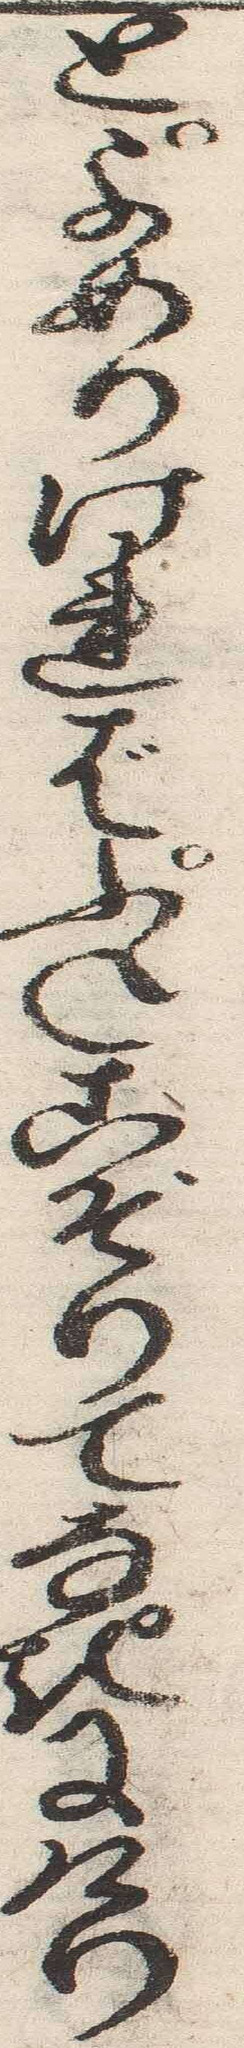と。よめりければ。ふねこぞりてなきにけり
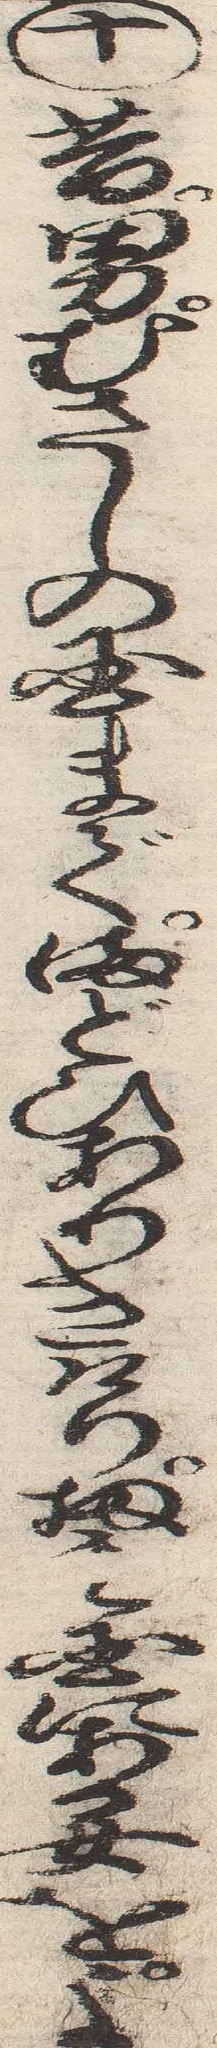㊉昔。男。むさしの国まで。まどひありきけり。扨其国にある女を。よ
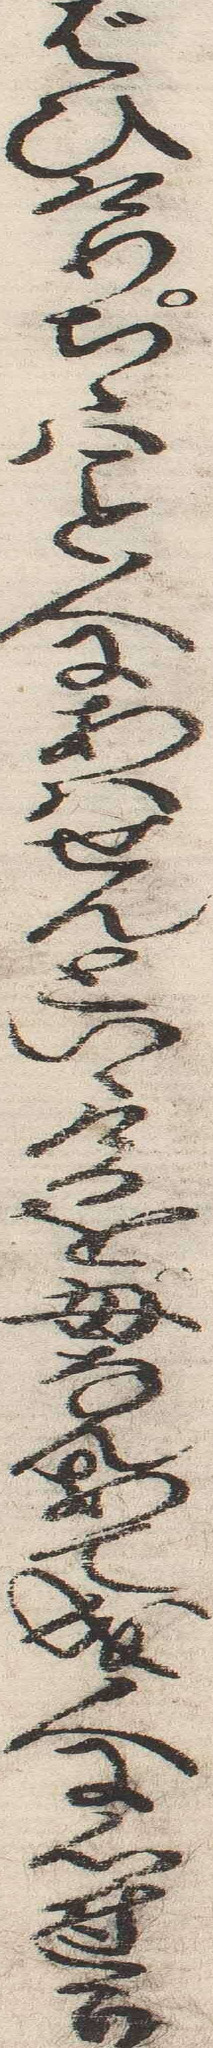ばひけり。ちゝはこと人にあはせんといゝけるを。母なんあて成人に心付たり
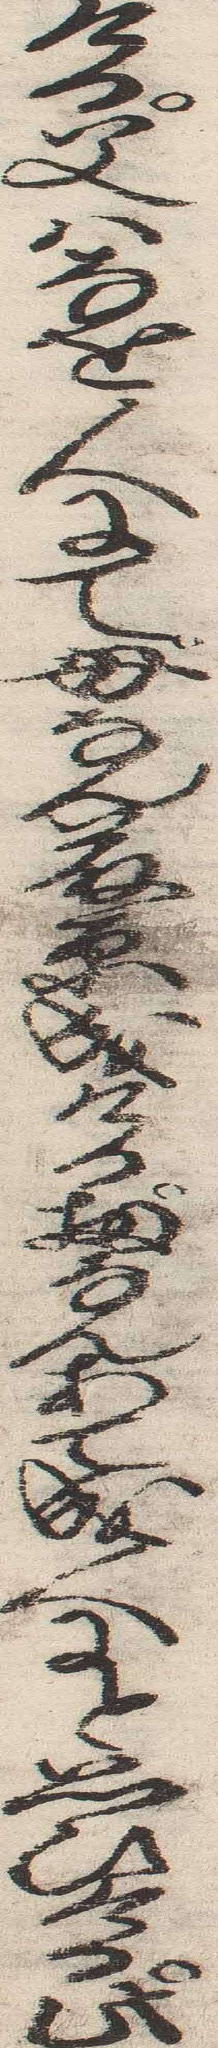ける。父はなを人にて。母なん藤原成ける。扨なんあて成人にと思ひける。此
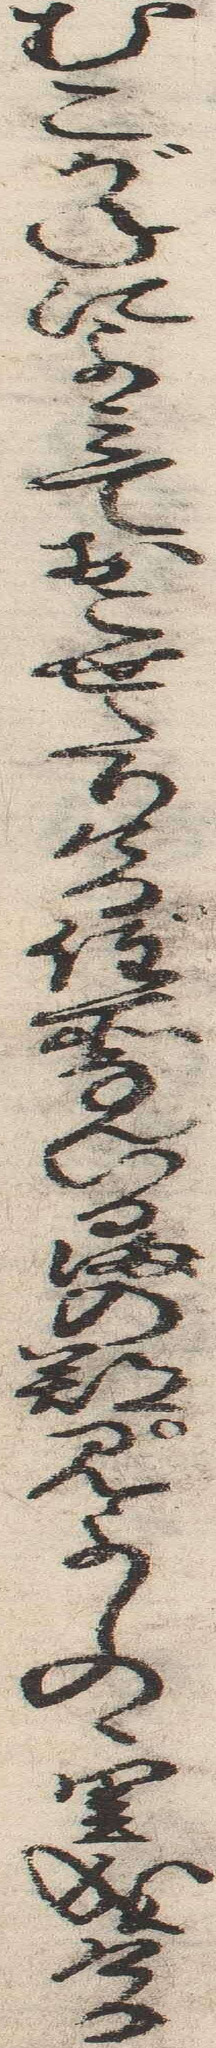むこがねによみておこせたりける。住所なんいるまの郡。みよしのゝ里成ける

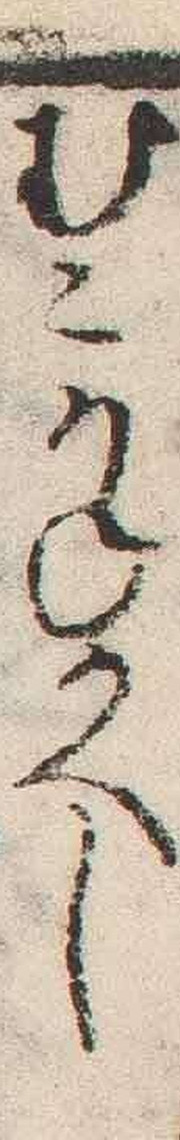むこかねかへし
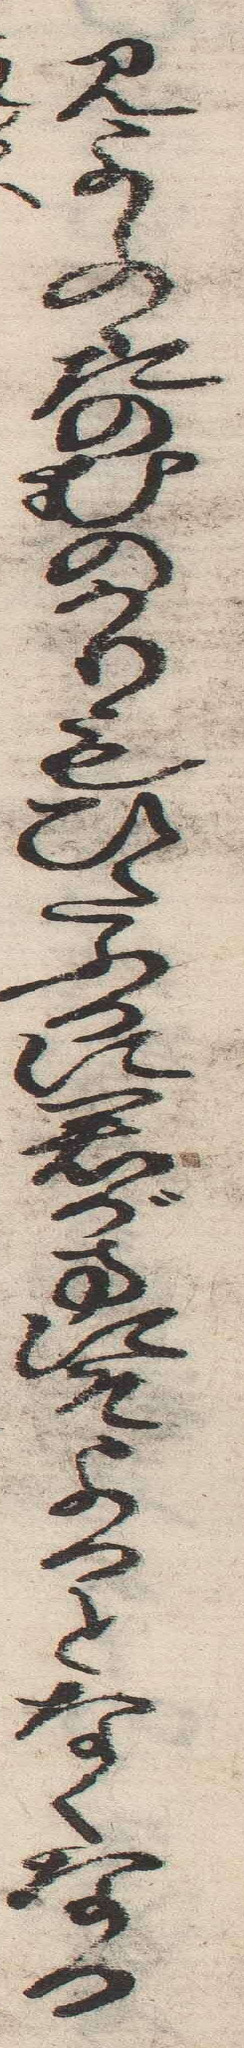みよしのゝたのむのかりもひたふるに君が方にそよるとなくなる
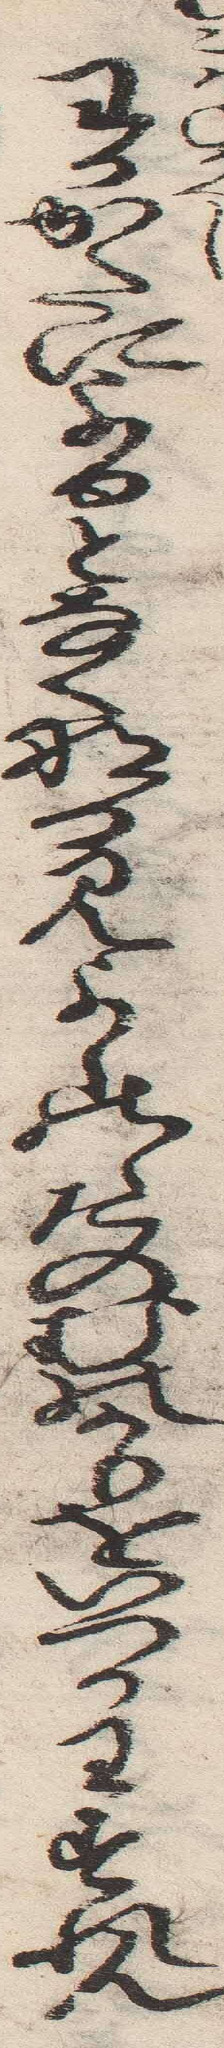わかかたによるとなくなるみよしのゝたのむのかりをいつかわすれん
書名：伊勢物語
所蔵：東京学芸大学附属図書館 国文学研究資料館
